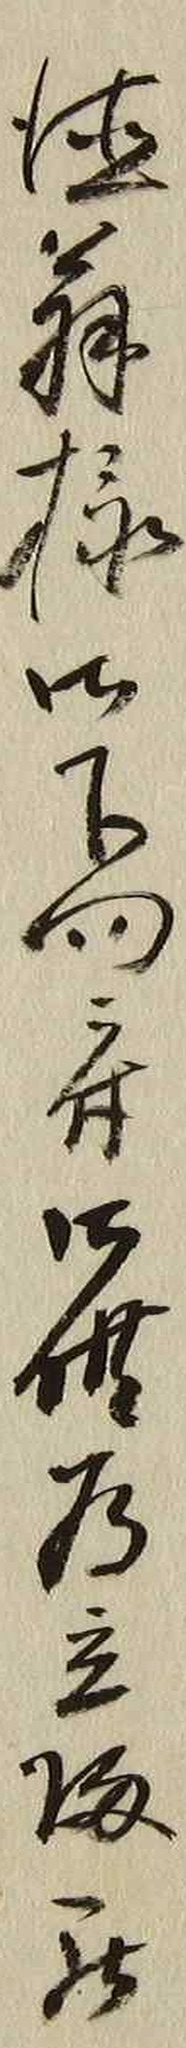徳翁様御下向ニ付御供為立帰罷
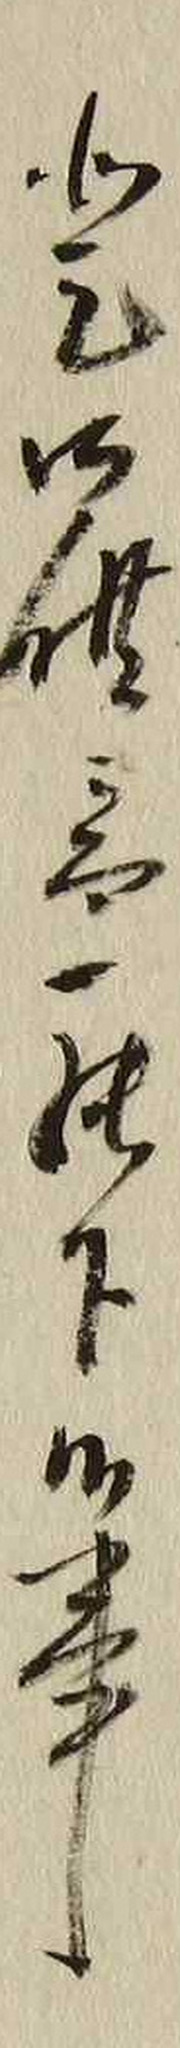登御供ニ而罷下候事
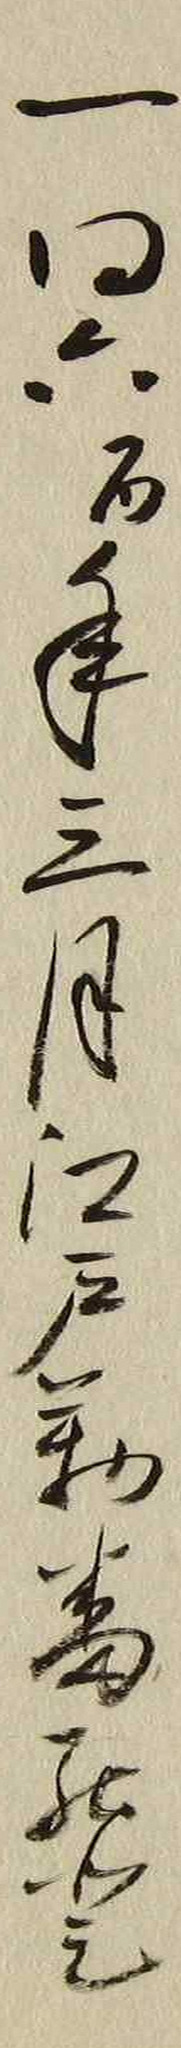一同六酉年三月江戸勤番罷登
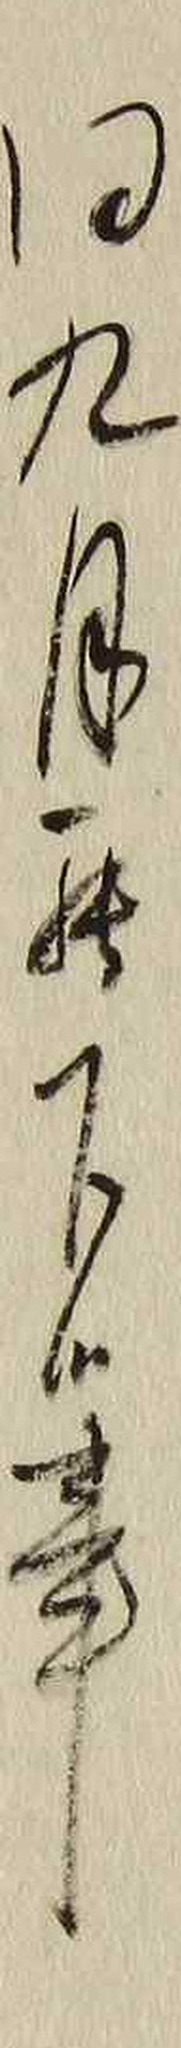同九月罷下候事
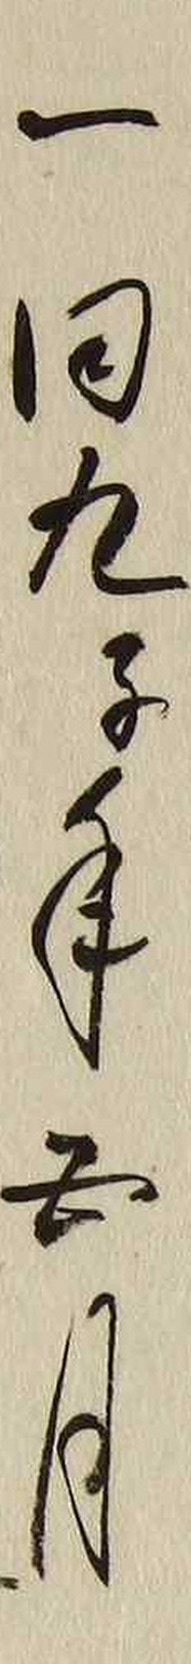一同九子年五月
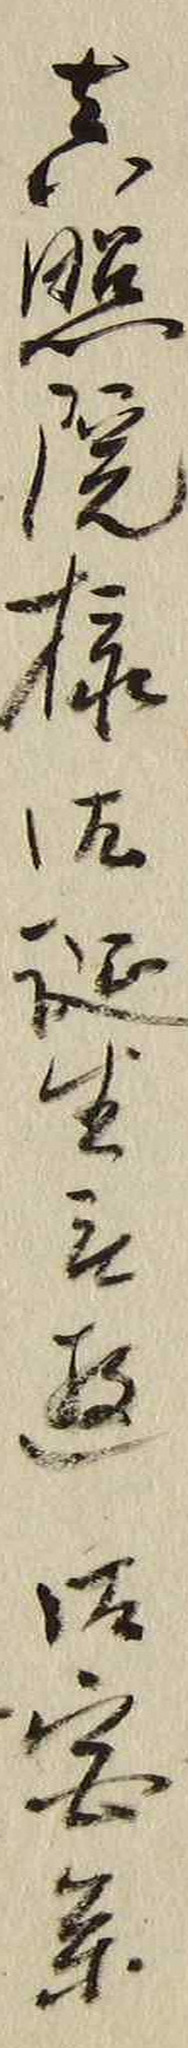真照院様御誕生被遊御宮参
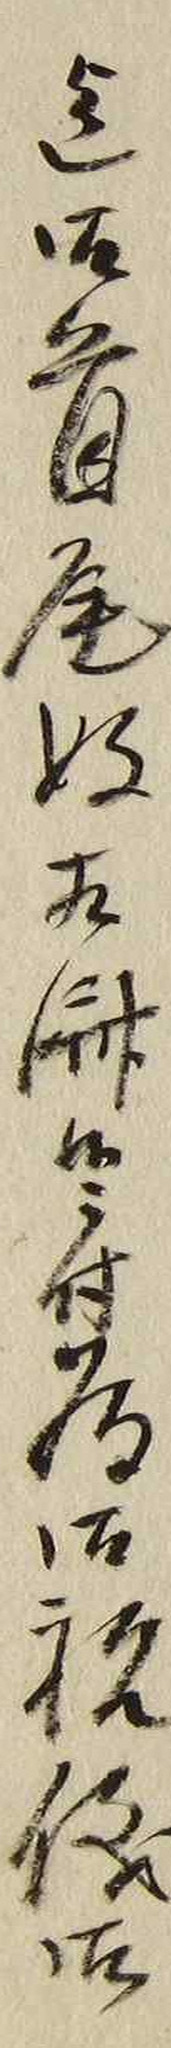迄御首尾好相済候ニ付為御祝儀御

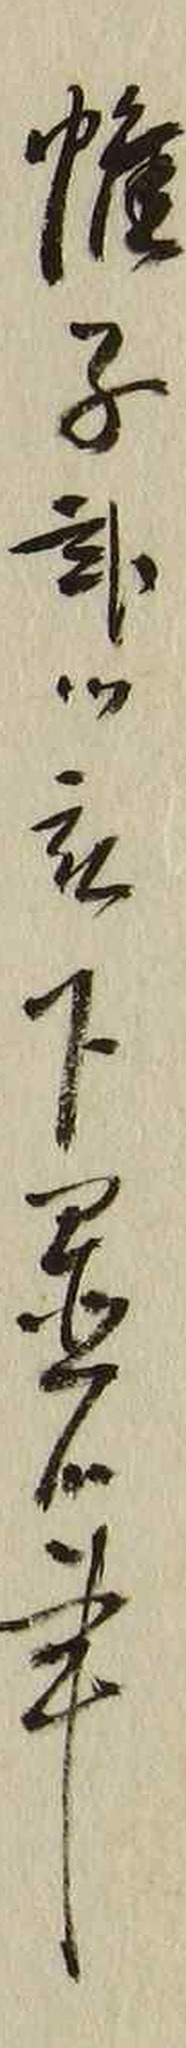帷子弐ツ被下置候事
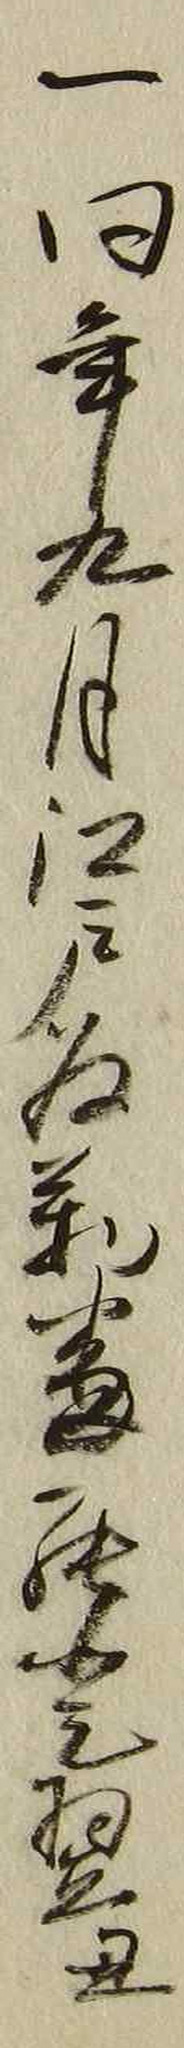一同年九月江戸為勤番罷登翌丑
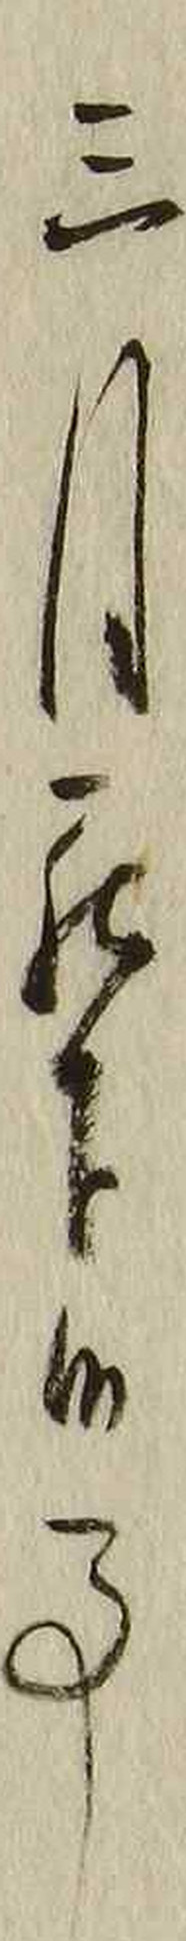三月罷下候事
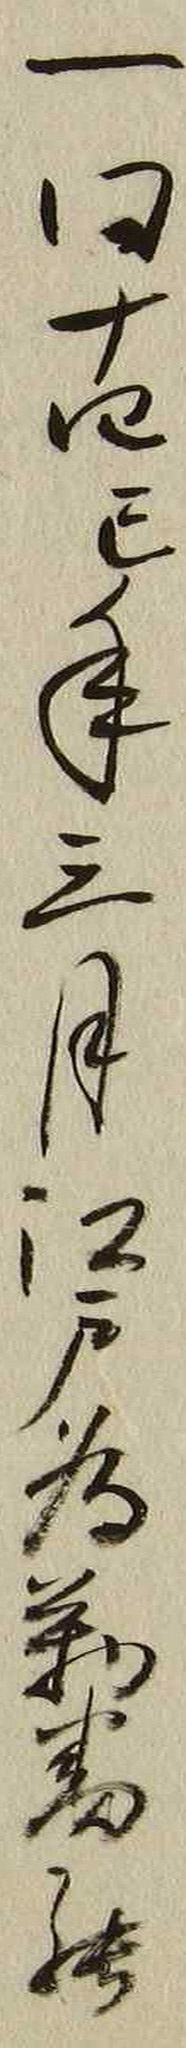一同十四巳年三月江戸為勤番罷
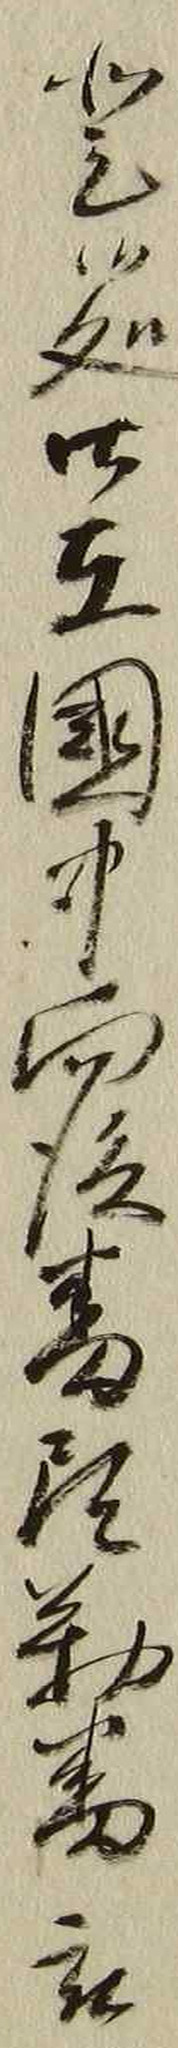登候処御在国中向後番頭勤番被
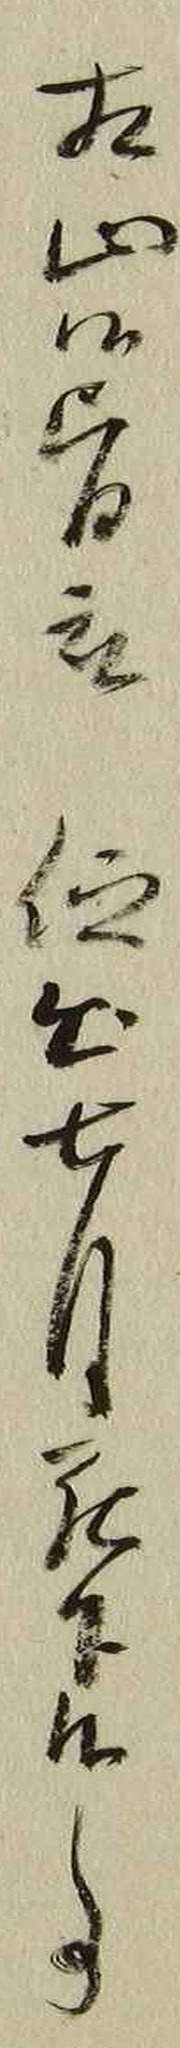相止候旨被仰出七月罷下候事
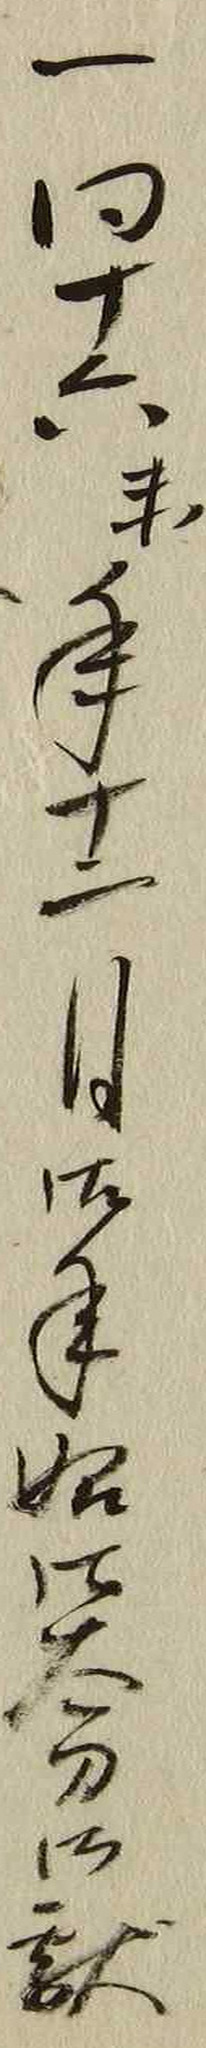一同十六未年十一月御年始御太刀御献
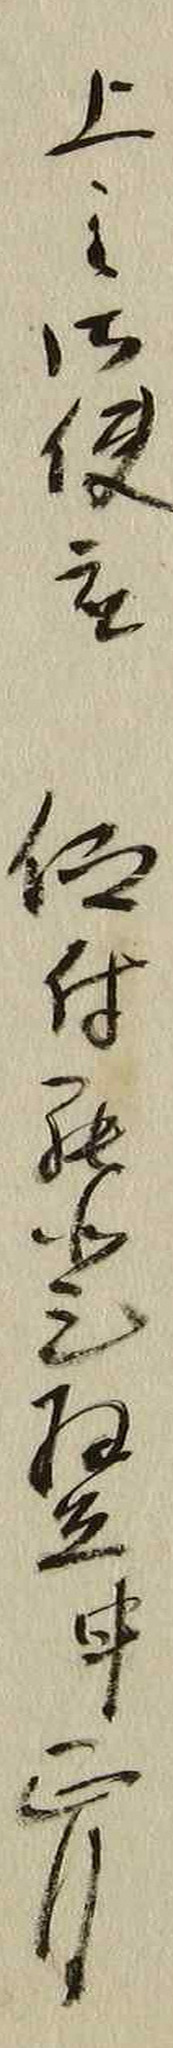上之御使被仰付罷登翌月申正月
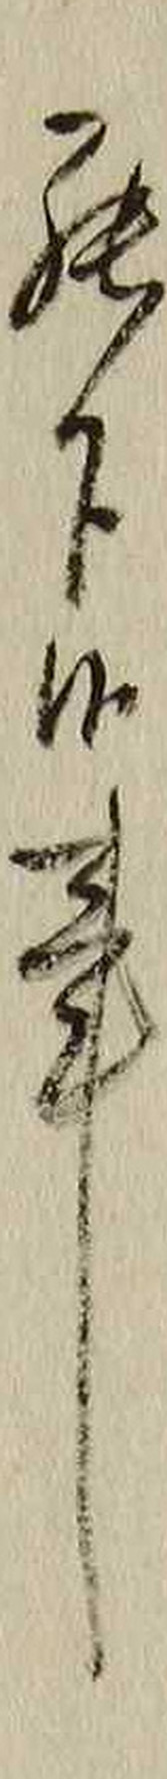罷下候事
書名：諸士系譜　巻之351　す之部1
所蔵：会津若松市立会津図書館
